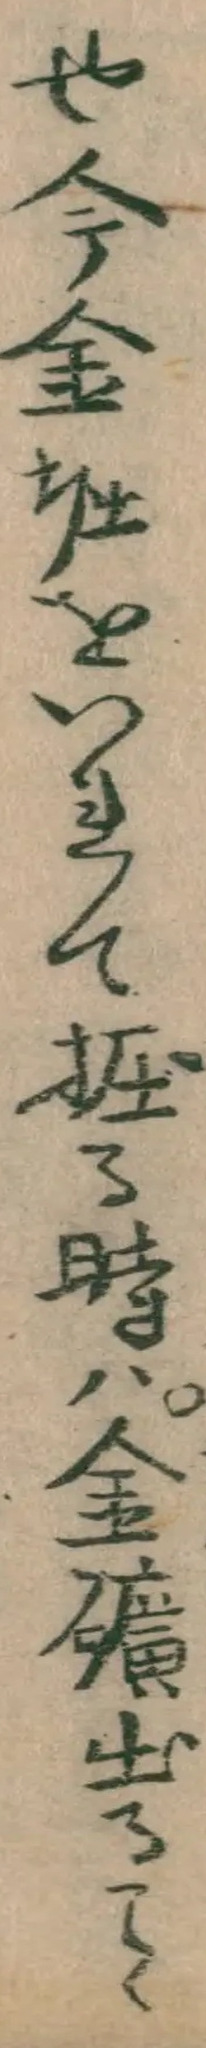也今金堀をいれて掘る時は金礦出ること
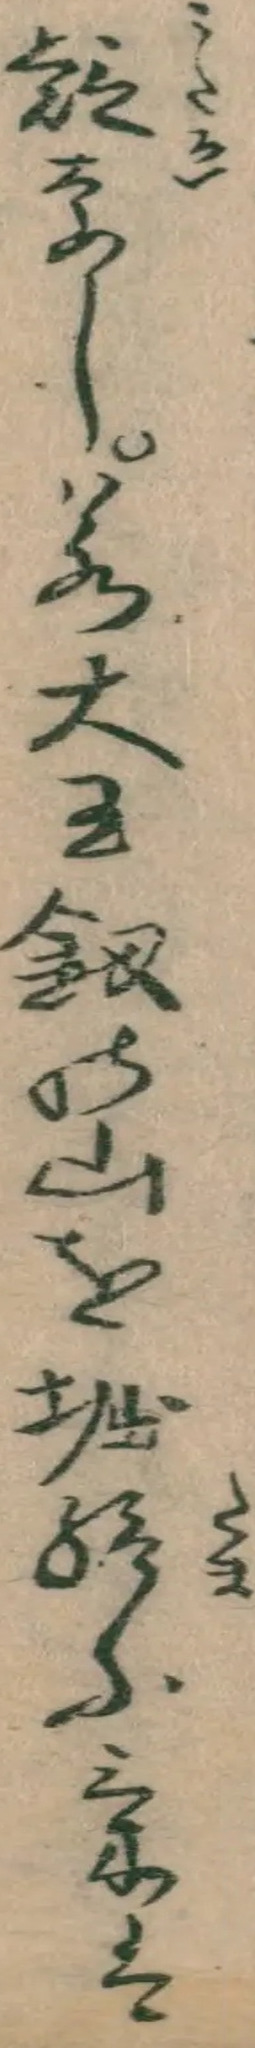疑なし。若大王釼の山を堀給ふ気は
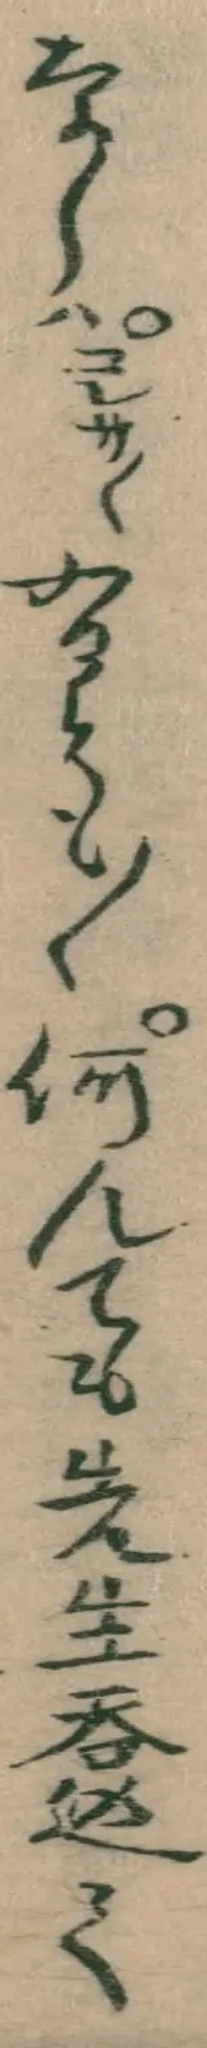なし。コレサ〳〵有とも〳〵。何んても先生呑込て
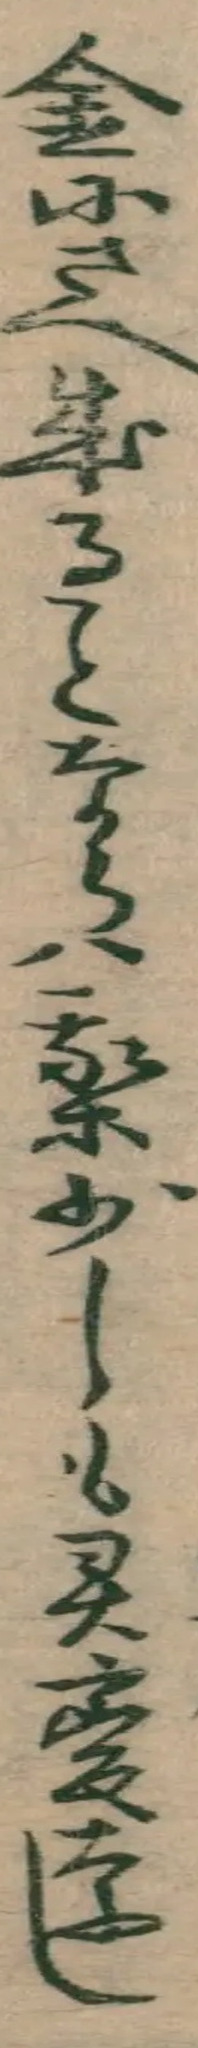金にさへ成ることならは我等少しも異変なし
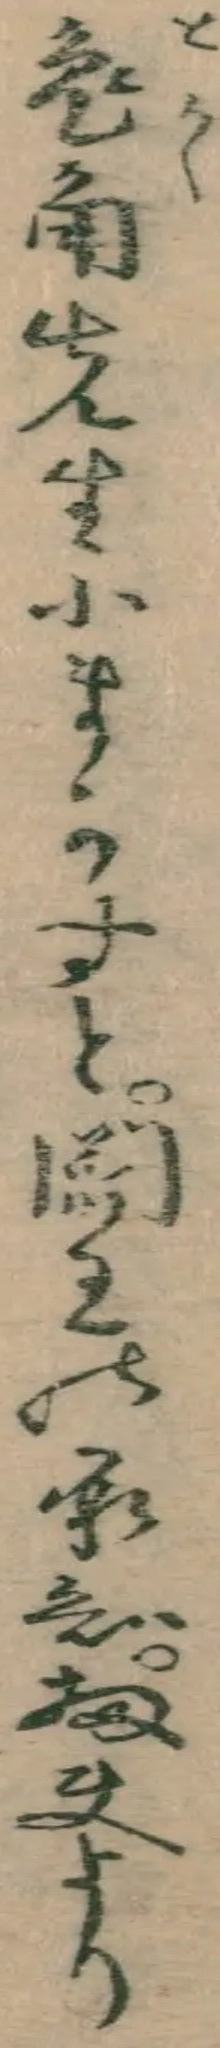兎角先生にまかすと。閻王の承知。扨夫より
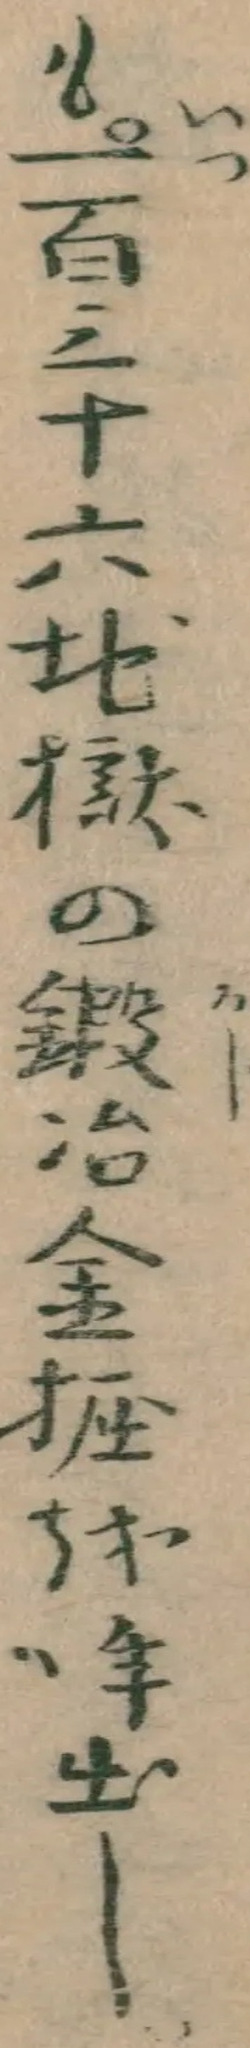も。一百三十六地獄の鍛冶金掘を呼出し。
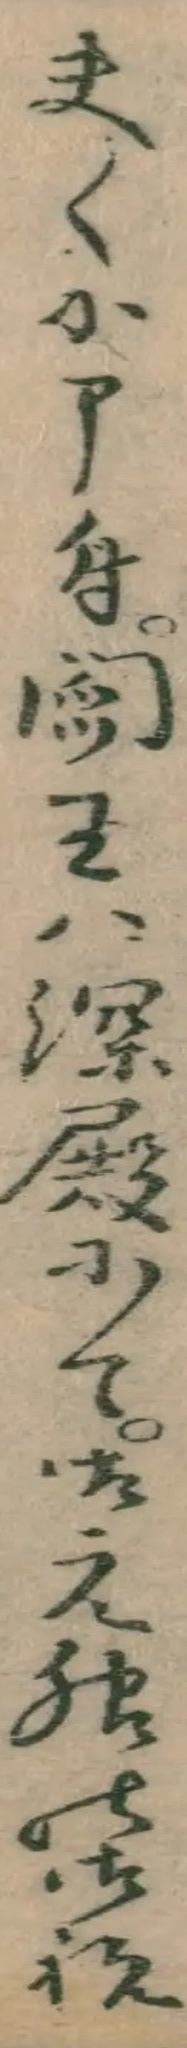夫〳〵に申付。閻王は深殿にて。御元服の御祝
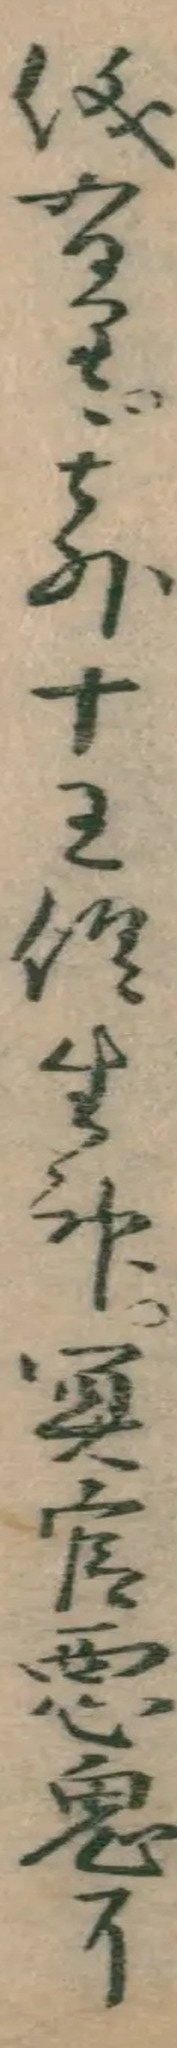儀有り。其外十王俱生神。冥官悪鬼に
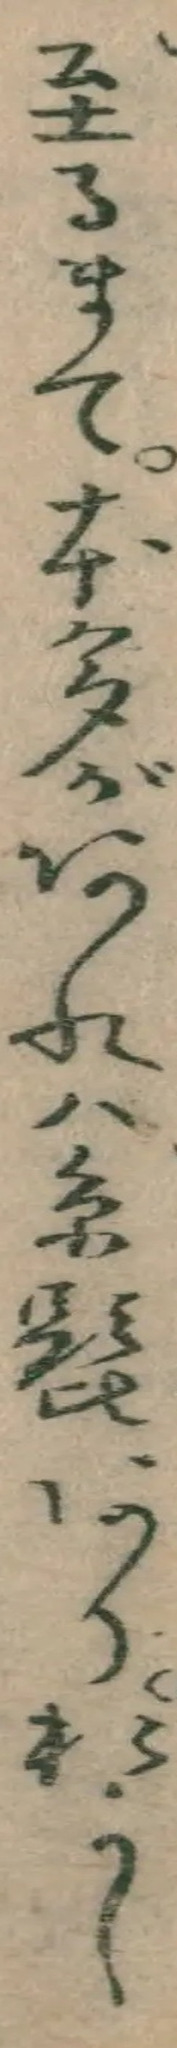至るまて。本多があれは糸髭あり。おかし
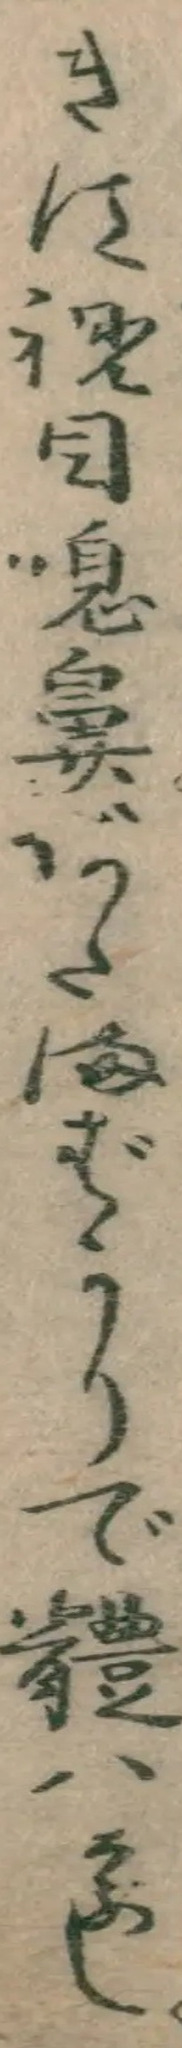きは視目嗅鼻。あたまばかりで体はなし。
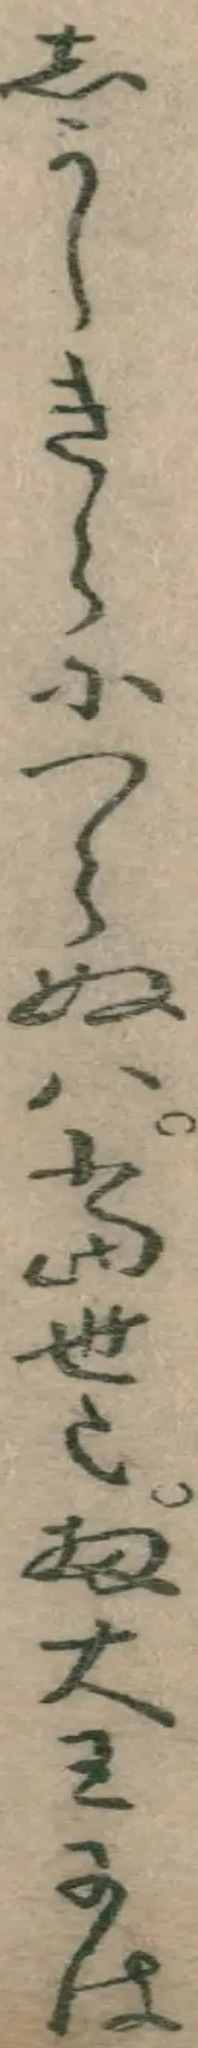しかしきらにつらぬは。当世也。扨大王には
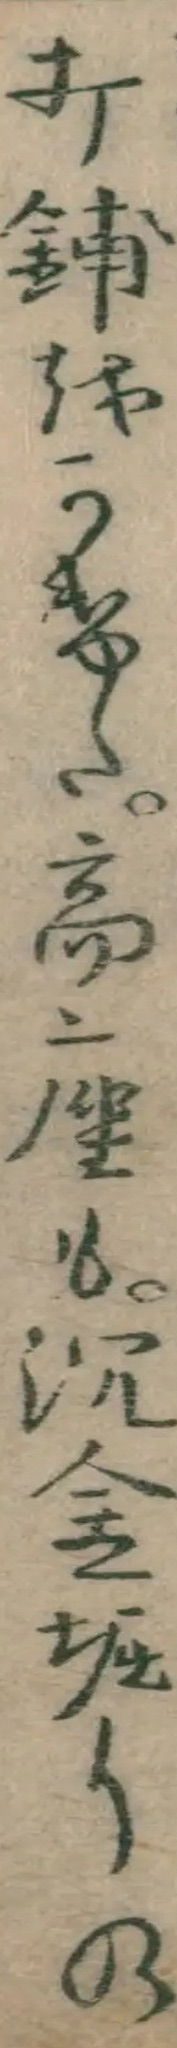打鋪をかけた。高座も。沈金堀りの

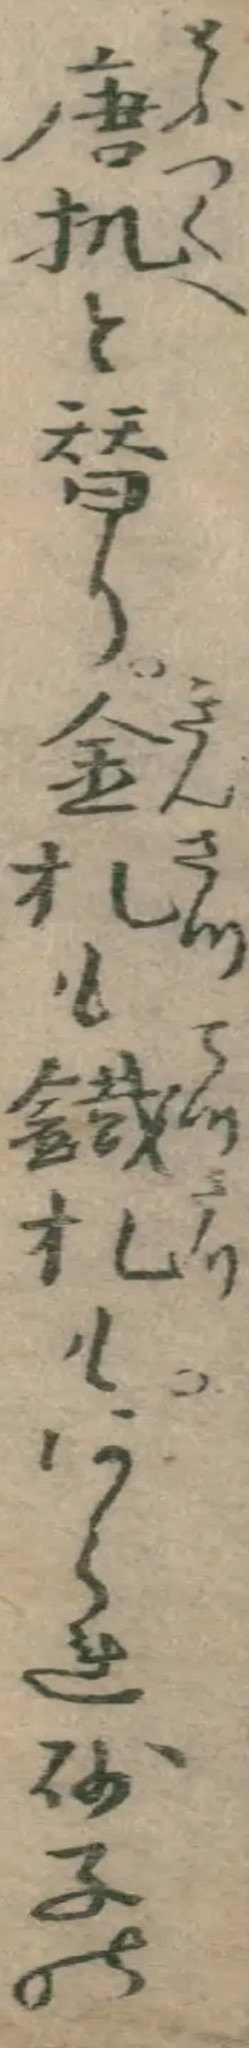唐机と替り。金札も鉄札も。あられ砂子の
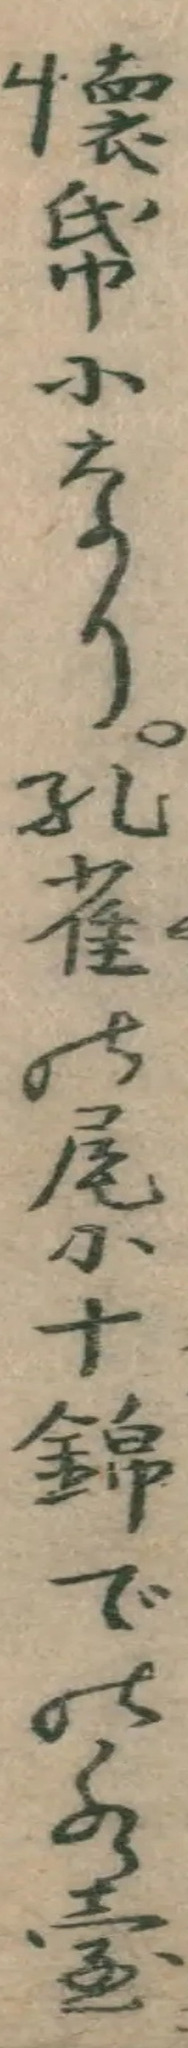懐紙になり。孔雀の尾に十錦での水壺
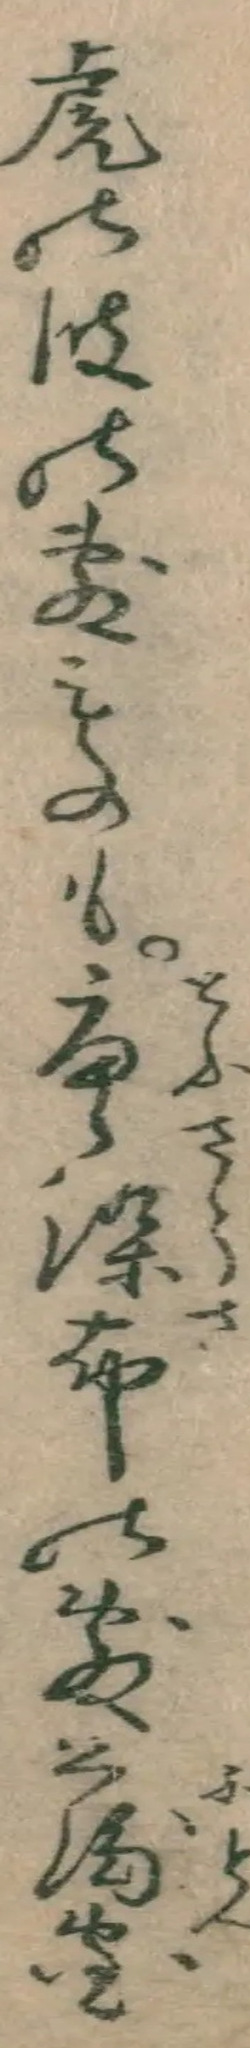虎の皮の敷ものも。唐染布の敷蒲団
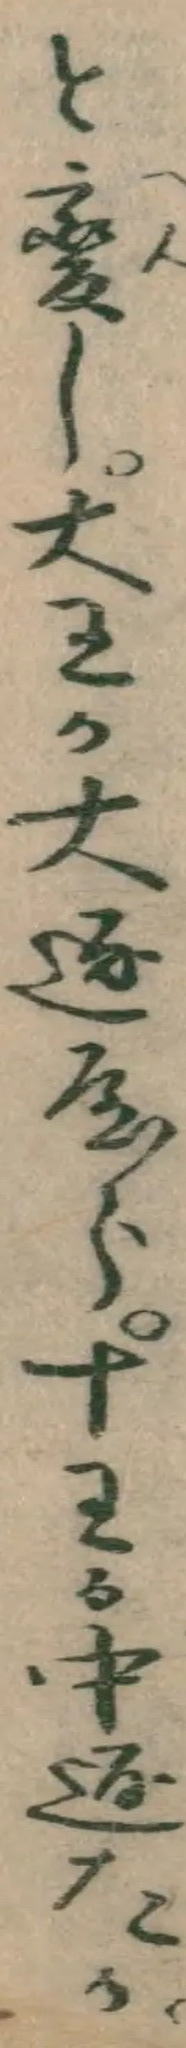と変し。大王か大通やら。十王か中通だか。
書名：翻草盲目
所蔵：国立国会図書館 National Diet Library, JAPAN
